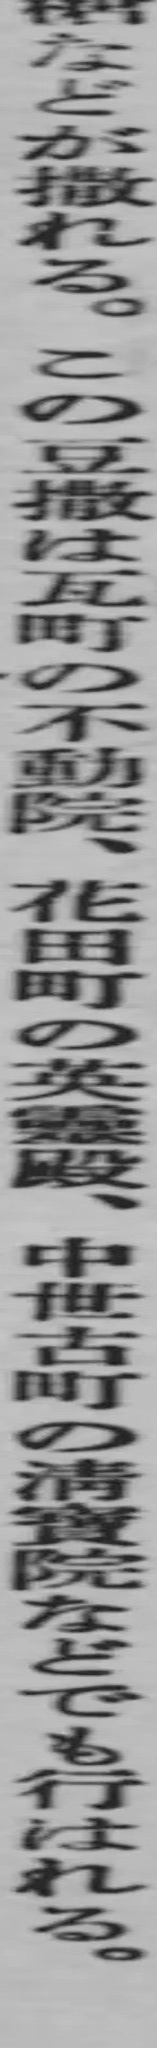糖などが撒れる。この豆撒は瓦町の不動院、花田町の英靈殿、中世古町の淸寶院などでも行はれる。
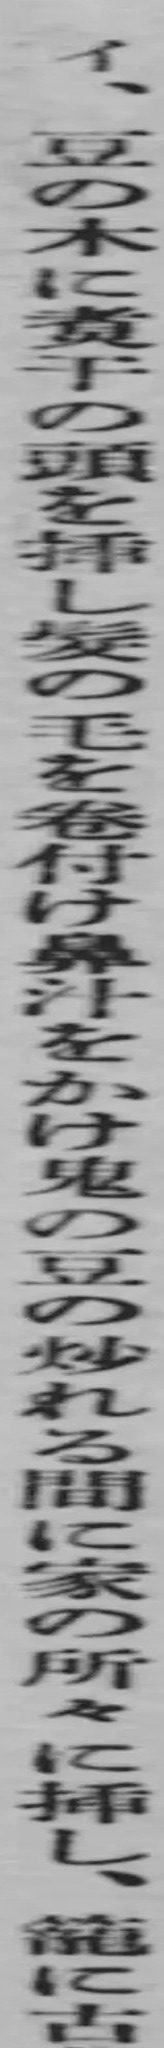イ、豆の木に煑干の頭を挿し髪の毛を卷付け鼻汁をかけ鬼の豆の炒れる間に家の所々に挿し、籠に古草
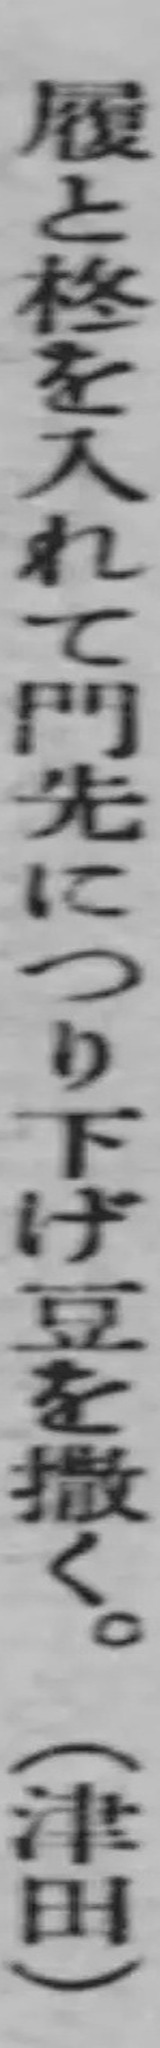履と柊を入れて門先につり下げ豆を撒く。(津田)
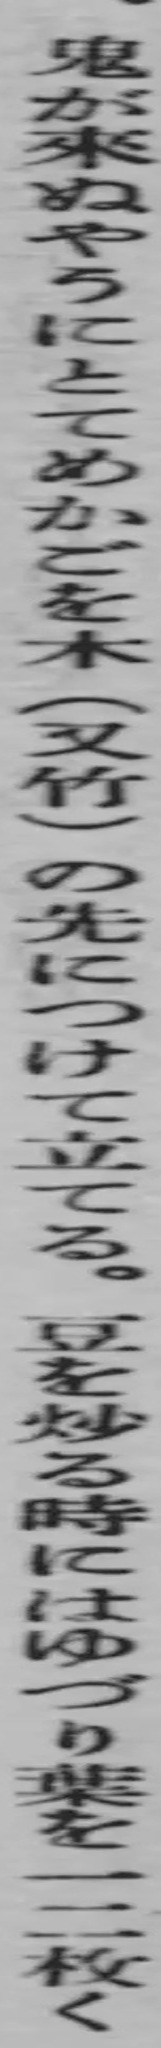ロ、鬼が來ぬやうにとてめかごを木(又竹)の先につけて立てる。豆を炒る時にはゆづり葉を一二枚く
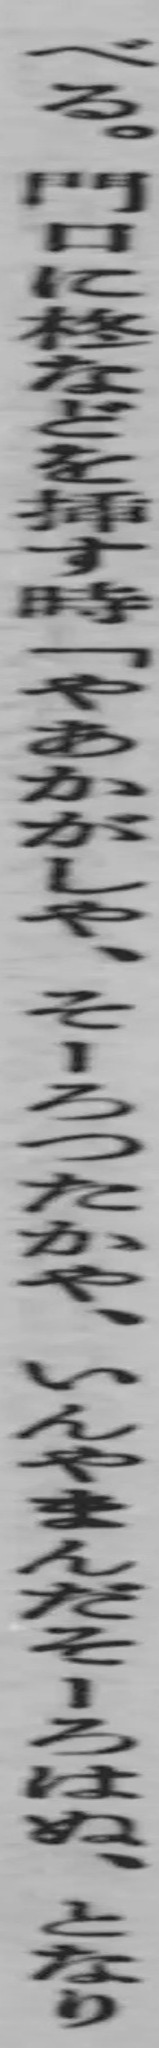べる。門口に柊などを挿す時「やあかがしや、そーろつたかや、いんやまんだそーろはぬ、となり
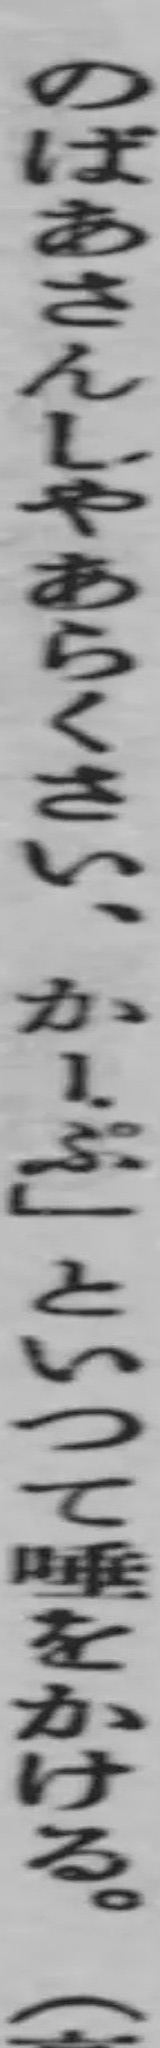のばあさんしやあらくさい、かーぷといつて唾をかける。(高師)
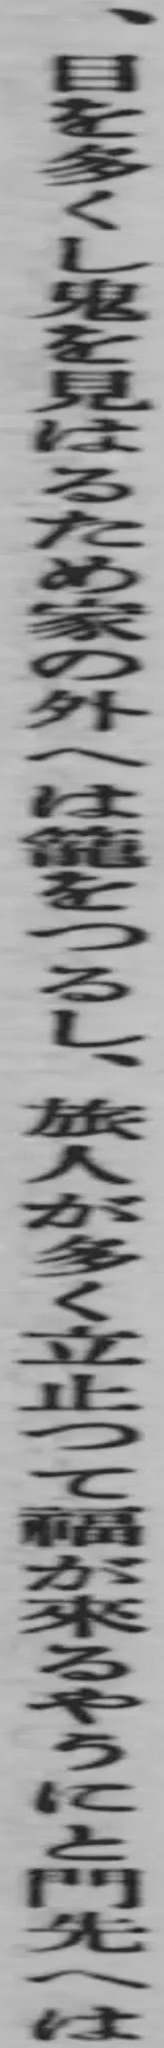ハ、目を多くし鬼を見はるため家の外へは籠をつるし、旅人が多く立止つて福が來るやうにと門先へは
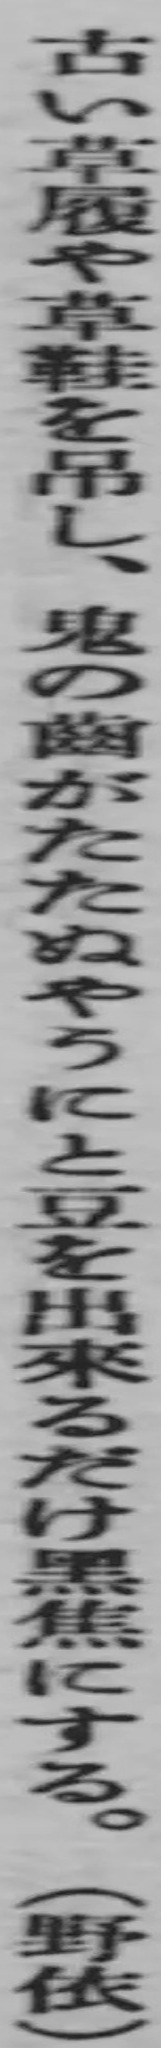古い草履や草鞋を吊し、鬼の齒がたたぬやうにと豆を出來るだけ黑焦にする。(野依)
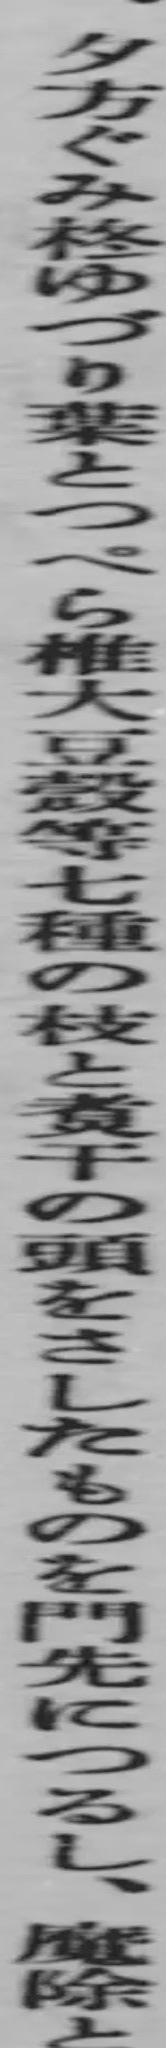ニ、夕方ぐみ柊ゆづり葉とつぺら椎大豆殼等七種の枝と煑干の頭をさしたものを門先につるし、魔除と
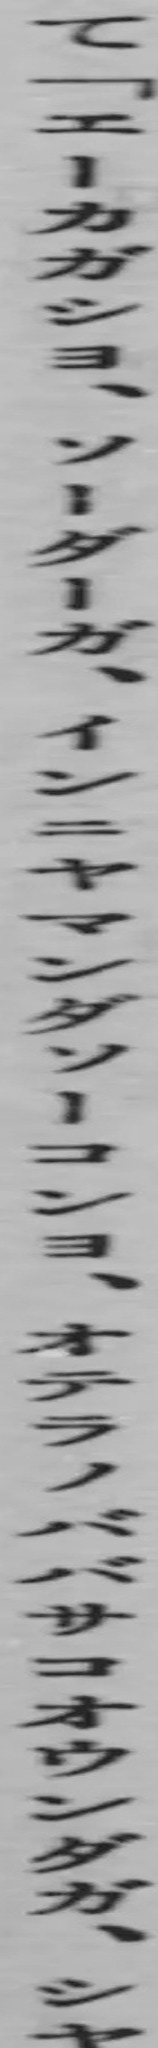て「エーカガシヨ、ソーダーガ、インニヤマンダソーコンヨ、オテラノババサコオウンダガ、シヤ
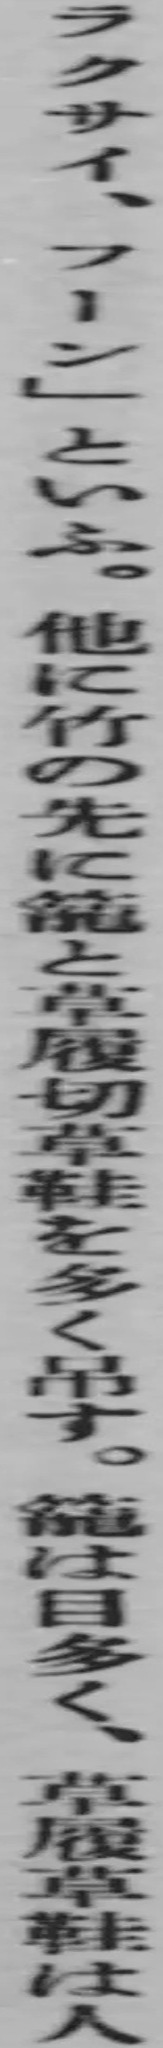ラクサイ、フーン」といふ。他に竹の先に籠と草履切草鞋を多く吊す。籠は目多く、草履草鞋は人
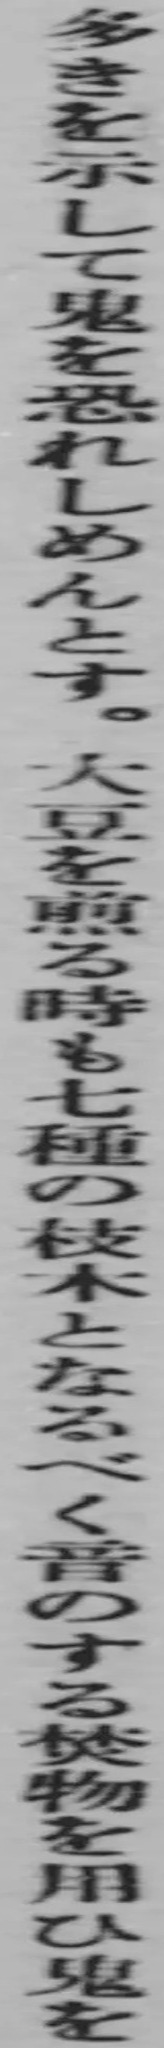多きを示して鬼を恐れしめんとす。大豆を煎る時も七種の枝木となるべく音のする焚物を用ひ鬼を
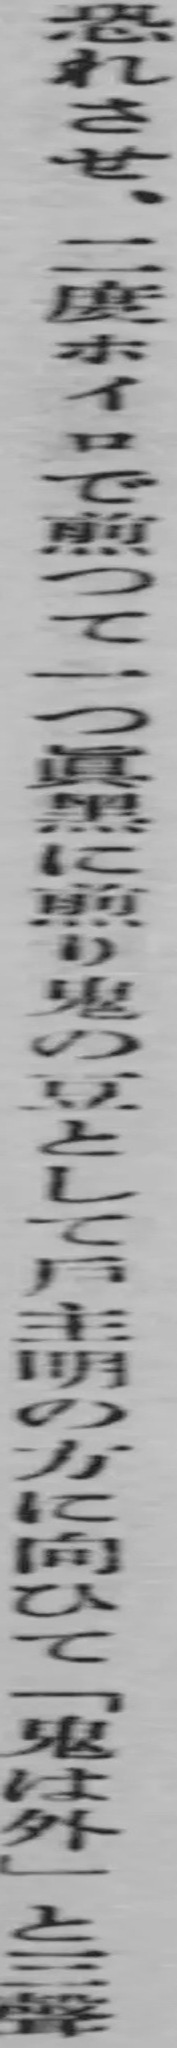恐れさせ、二度ホイロを煎つて一つ眞黑に煎り鬼の豆として戸主明の方に向ひて「鬼は外」と三聲
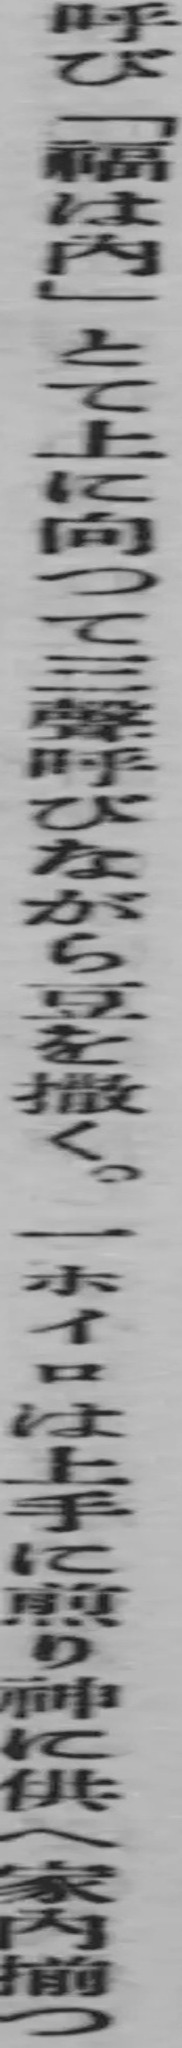呼び「福は内」とて上に向つて三聲呼びながら豆を撒く。一ホイロは上手に煎り神に供へ家内揃つ
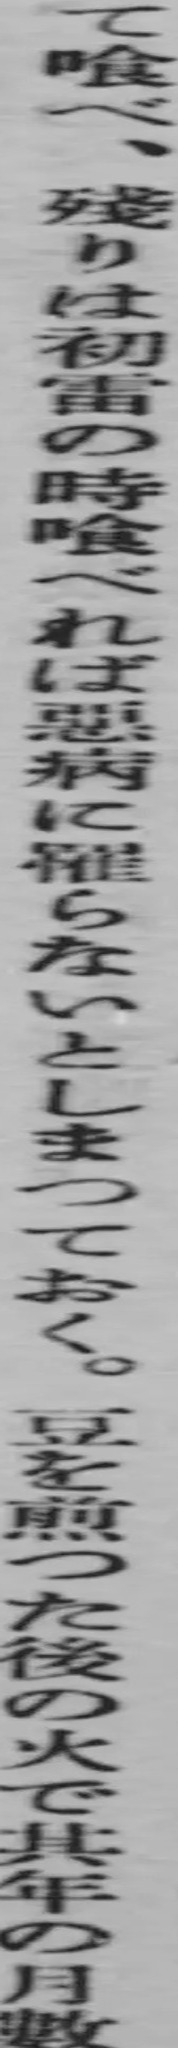て喰べ、殘りは初雷の時喰べれば惡病に罹らないとしまつておく。豆を煎つた後の火で其年の月數
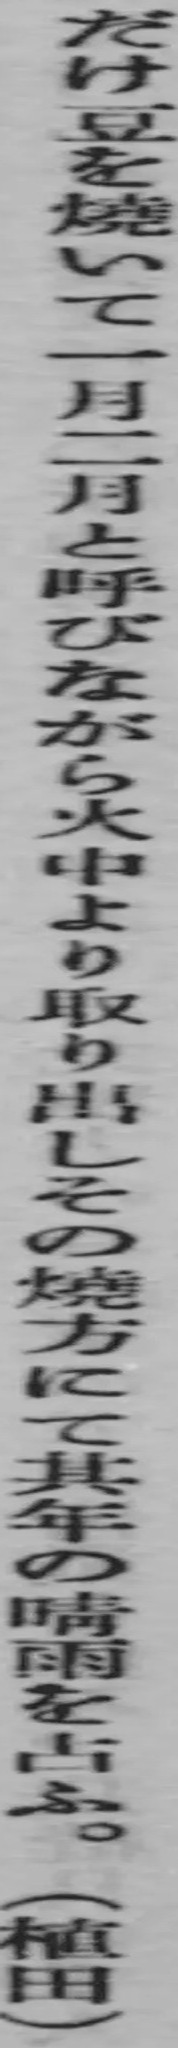だけ豆を燒いて一月二月と呼びながら火中より取り出しその燒方にて其年の晴雨を占ふ。(植田)
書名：豊橋の年中行事
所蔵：国立国会図書館 National Diet Library, JAPAN
